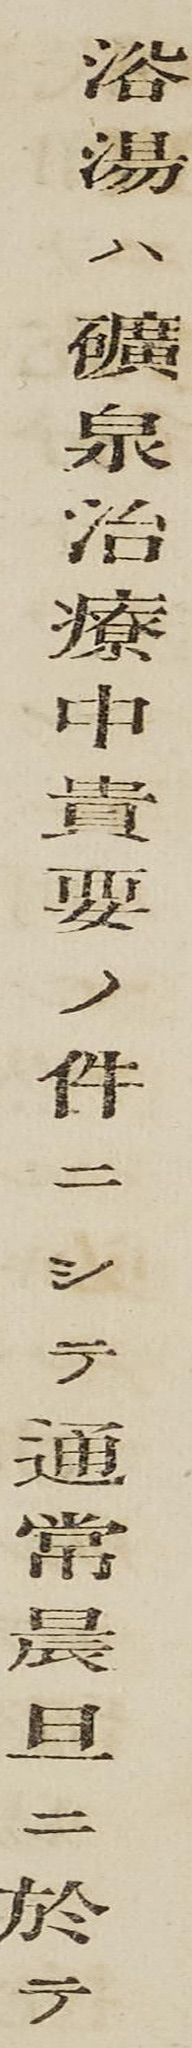浴湯ハ礦泉治療中貴要ノ件ニシテ通常晨旦ニ於テ
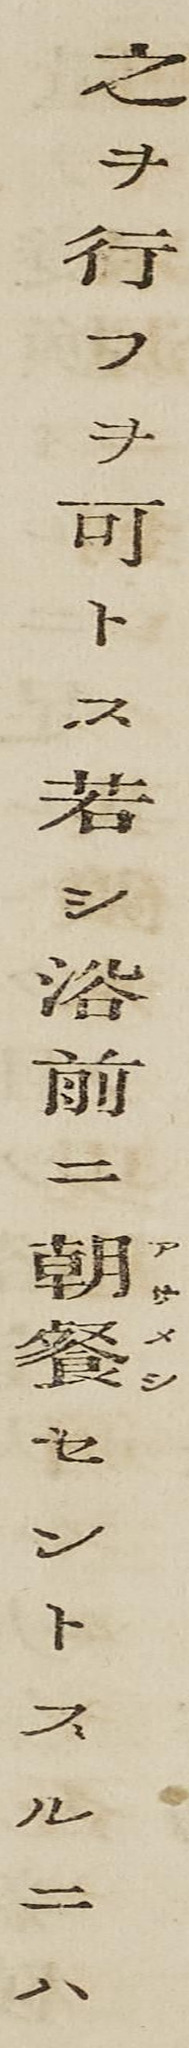之ヲ行フヲ可トス若シ浴前ニ朝餐セントスルニハ
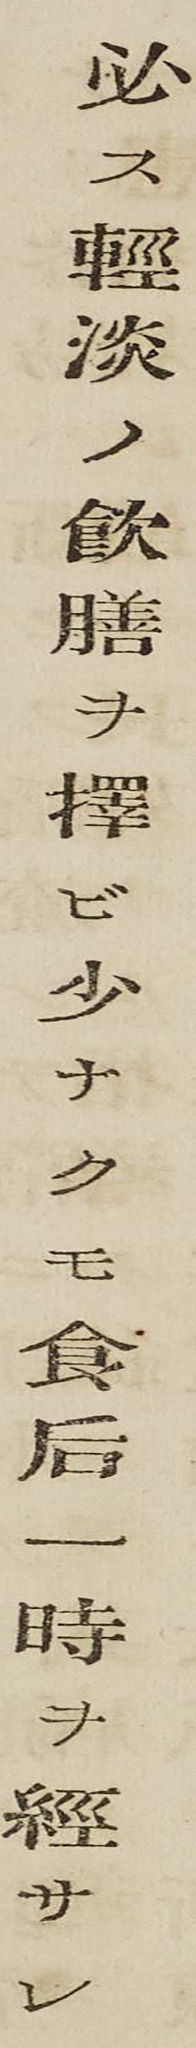必ス軽淡ノ飲膳ヲ択ビ少ナクモ食后一時ヲ経サレ
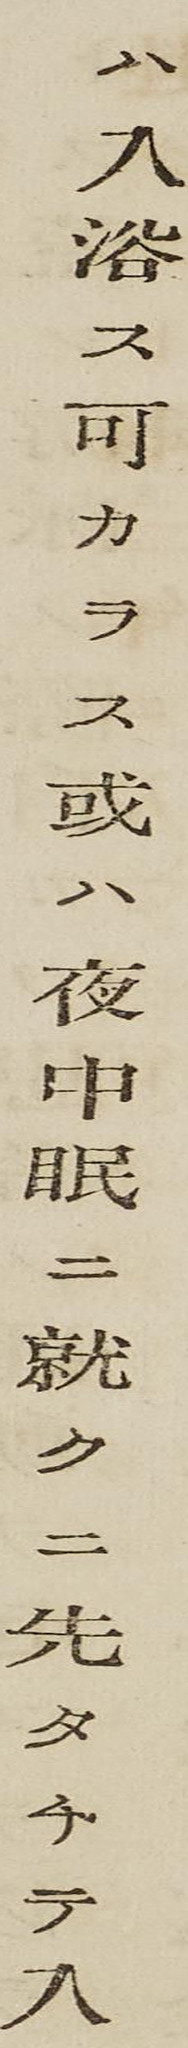ハ入浴ス可カラス或ハ夜中眠ニ就クニ先タチテ入
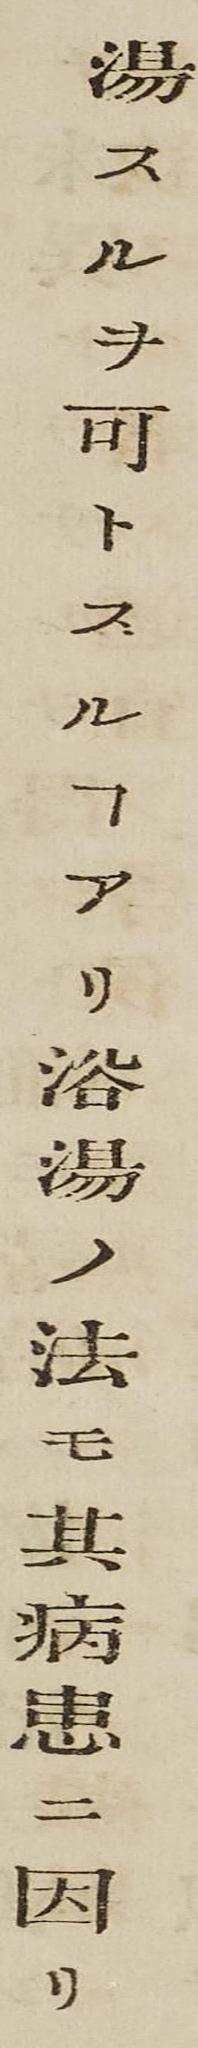湯スルヲ可トスルコトアリ浴湯ノ法モ其病患ニ因リ

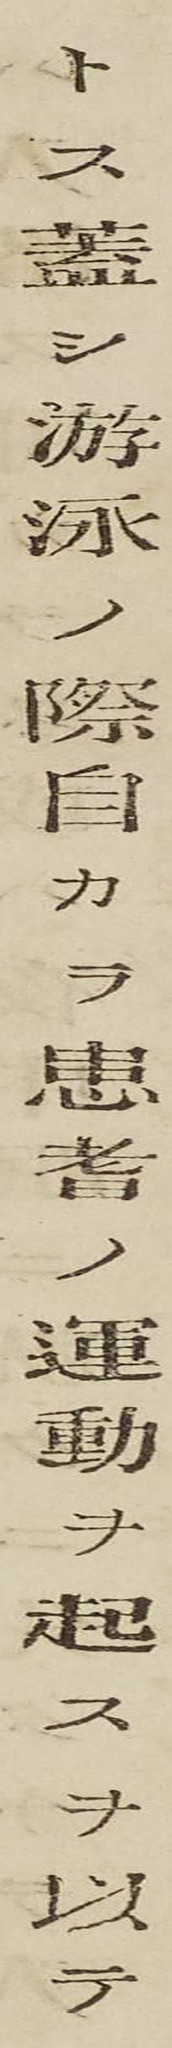トス蓋シ游泳ノ際自カラ患耆ノ運動ヲ起スヲ以テ
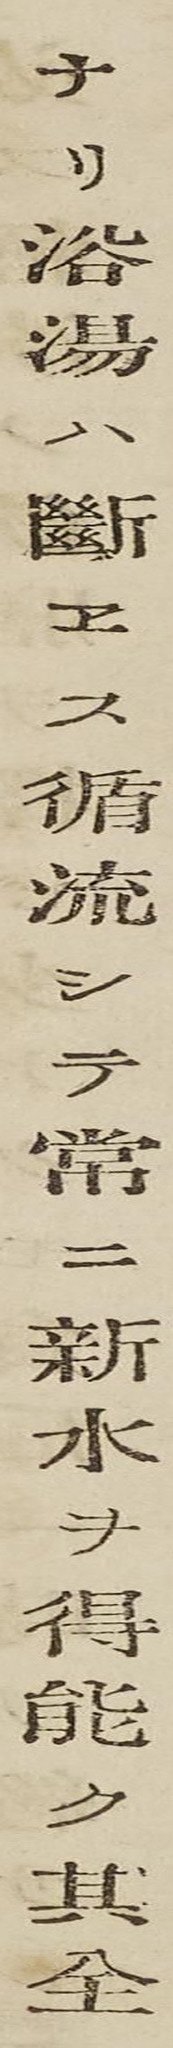ナリ浴湯ハ断ヱス循流シテ常ニ新水ヲ得能ク其全
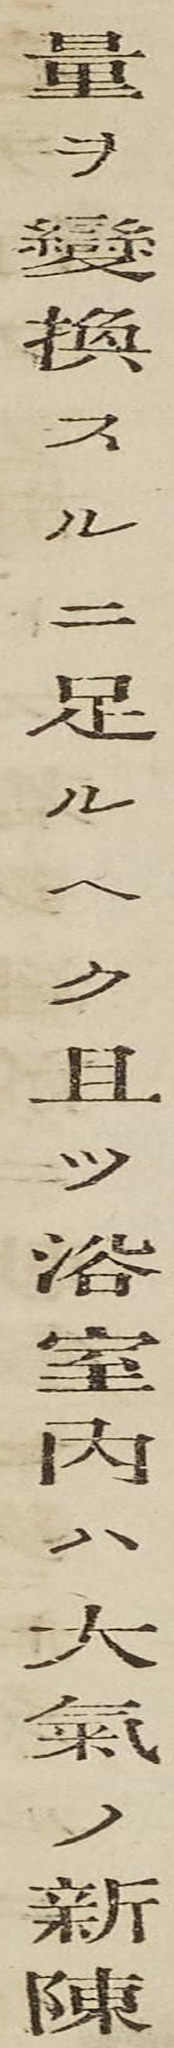量ヲ変換スルニ足ルヘク且ツ浴室内ハ大気ノ新陳
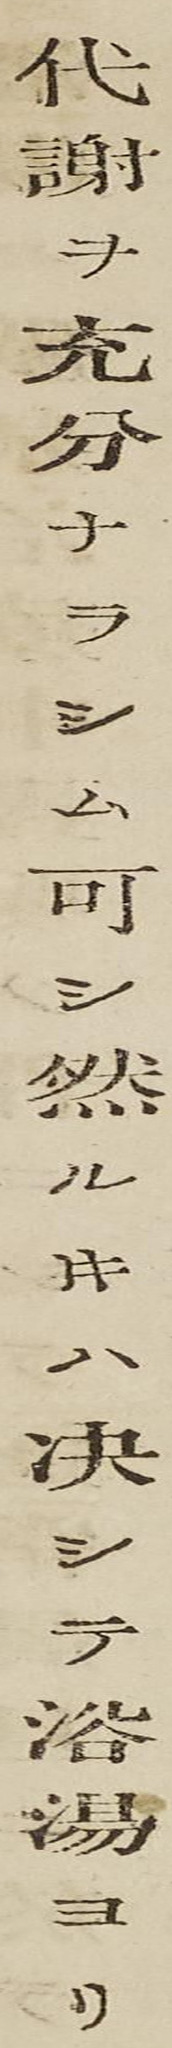代謝ヲ充分ナラシム可シ然ルトキハ決シテ浴湯ヨリ
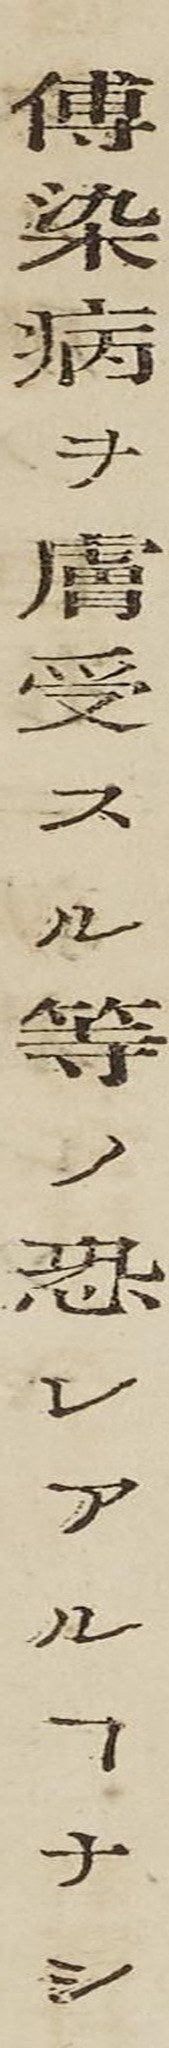伝染病ヲ膚受スル等ノ恐レアルコトナシ
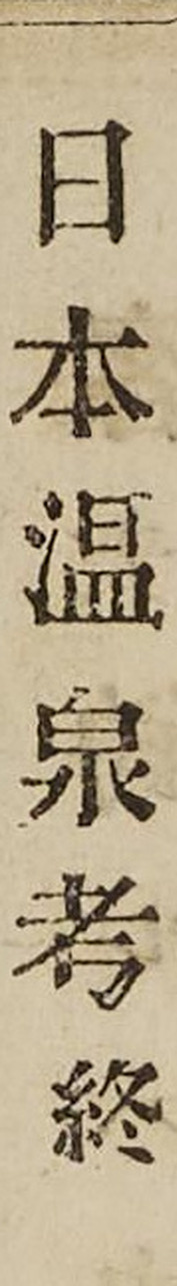日本温泉考終

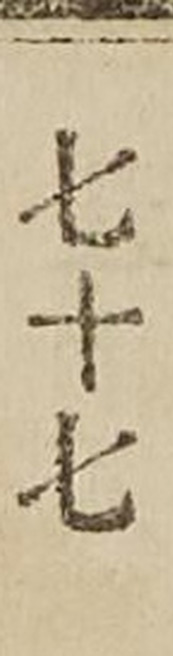七十二
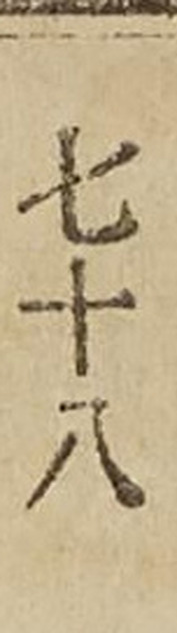七十二
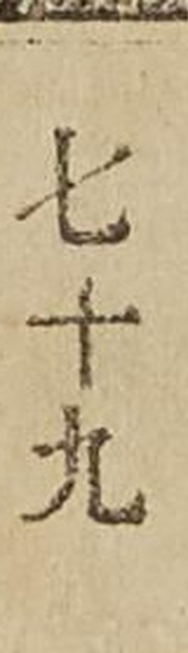七十二
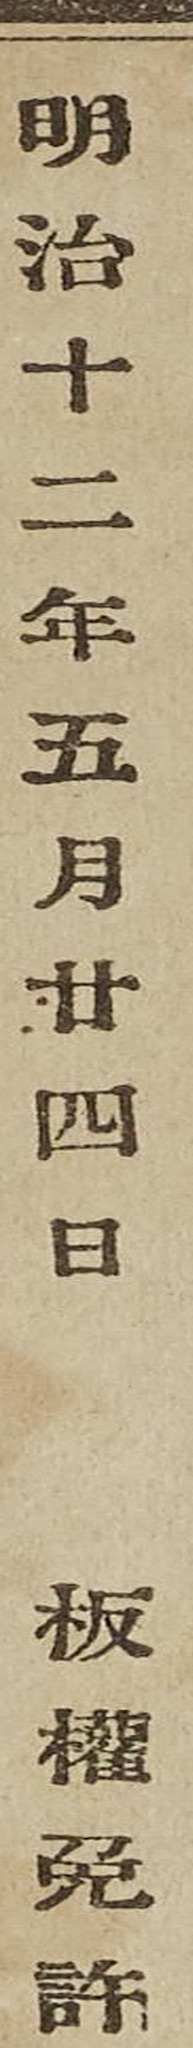明治十二年五月廿四日板権免許
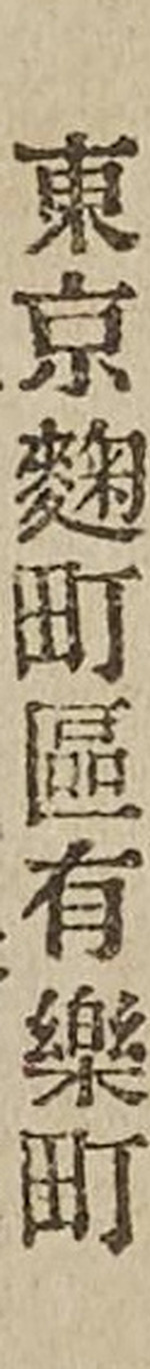東京麹町区有楽町
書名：日本温泉考
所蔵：東京大学地震研究所図書室 Earthquake Research Institute Library, The University of Tokyo, JAPAN
